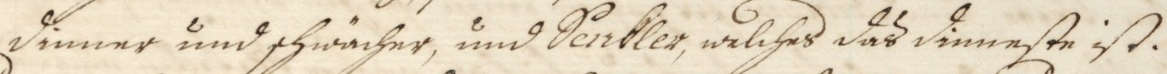dinner und schwächer, und Senkler, welches das dinneste ist.
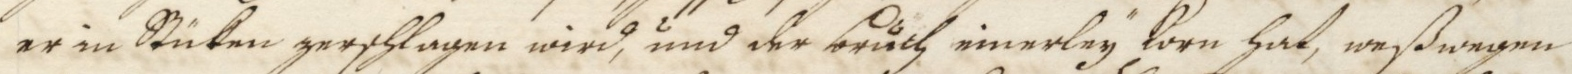er in Stücken zerschlagen wird, und der Bruch einerley Korn hat, weßwegen
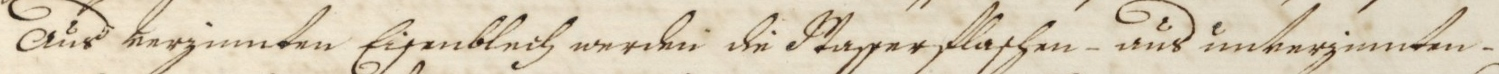Aus verzinnten Eisenblech werden die Wasserflaschen — aus unverzinnten.
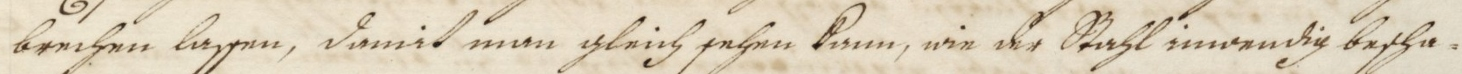brechen lassen, damit man gleich sehen kann, wie der Stahl inwendig bescha-
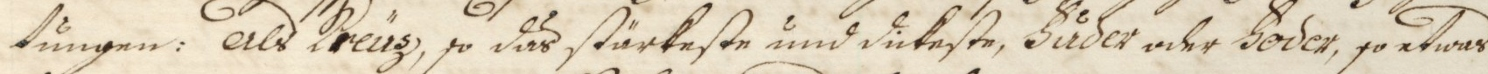tungen: Als Kreüz, so das stärkeste und dickeste, Fuder oder Foder, so etwas
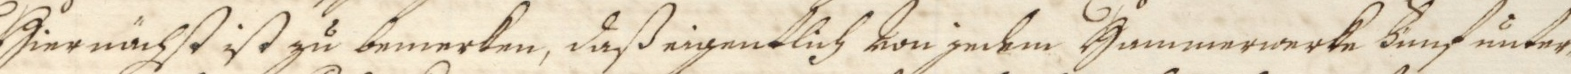Hiernächst ist zu bemerken, daß eigentlich von jedem Hammerwerke Funf unter-
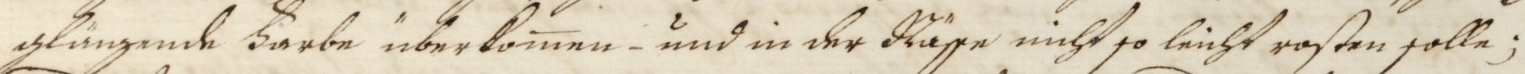glänzende Farbe überkommen — und in der Nässe nicht so leicht rosten solle;
